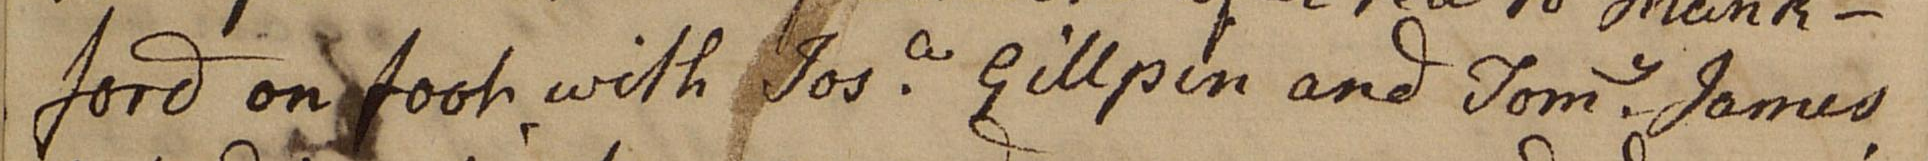ford on foot with Jos^a. Gillpin and Tom^y. James,
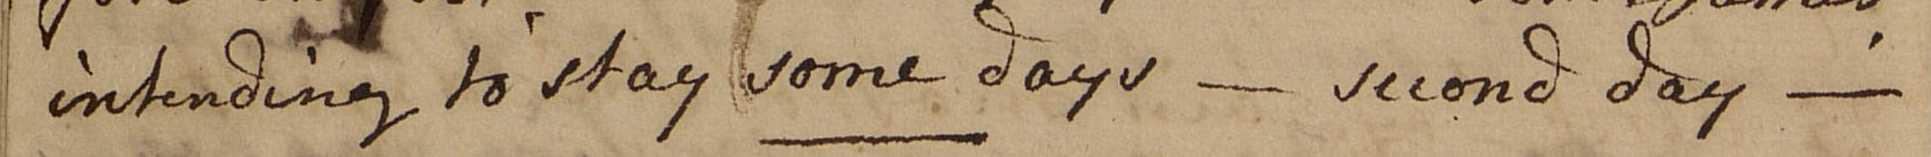intending to stay some days- second day-
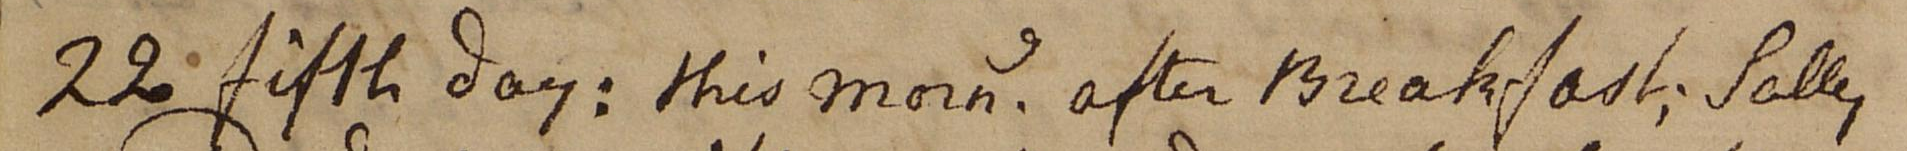28 fifth day: this morn^g. after Breakfast; Sally
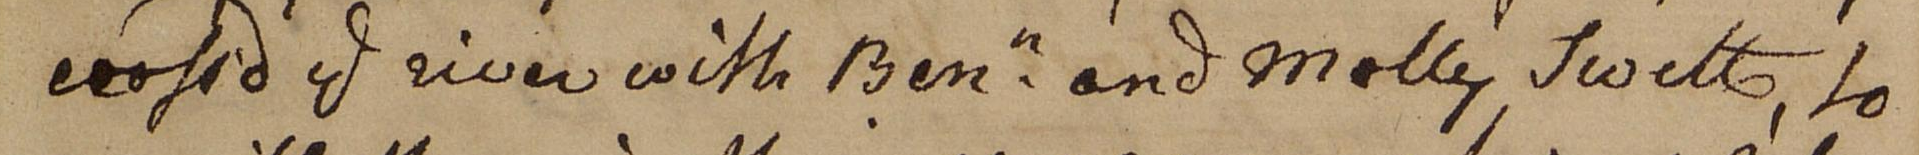cross'd y^e river with Ben^n. and Molly Swett, to
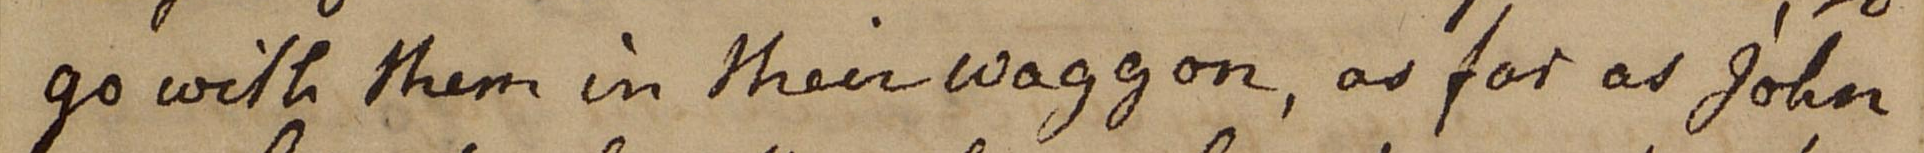go with them in their waggon, as far as John
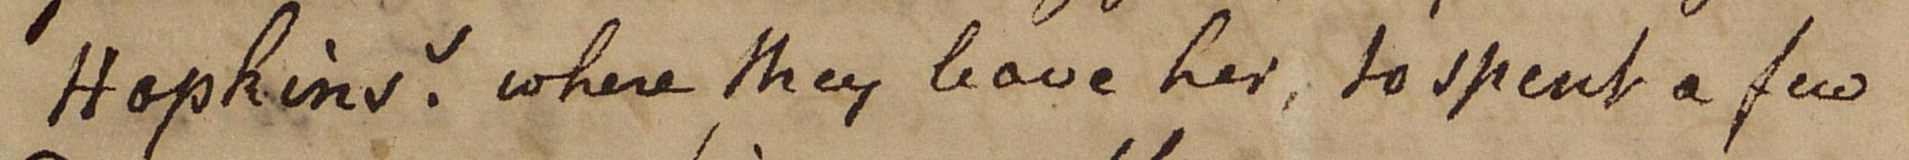Hopkins^s. where they leave her, to spent a few
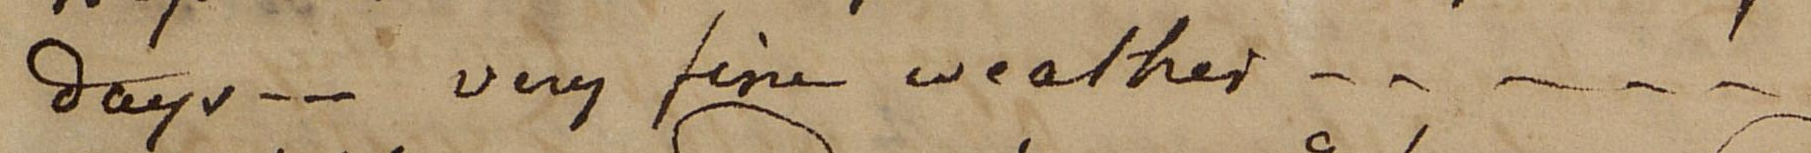days-- very fine weather-----
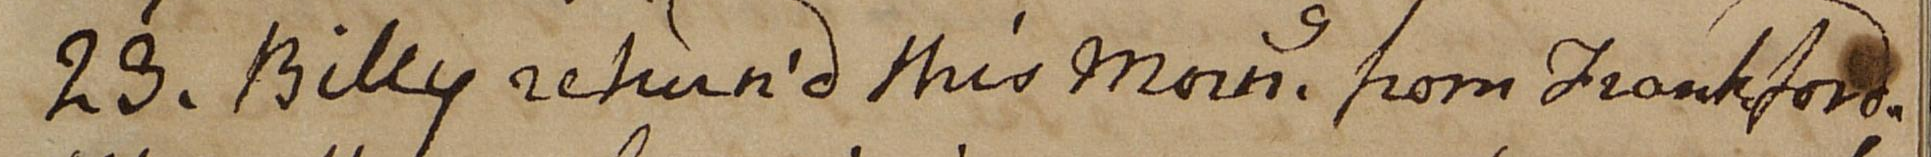23. Billy return'd this morn^g. from Frankford.
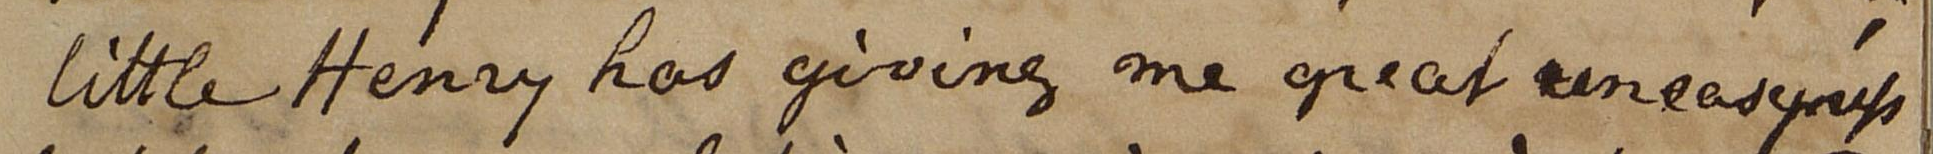little Henry has giving me great unsasyess
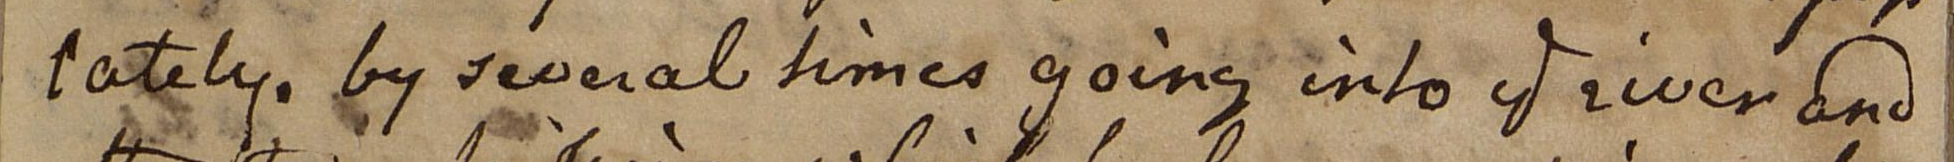lately. by several times going into y^e river and
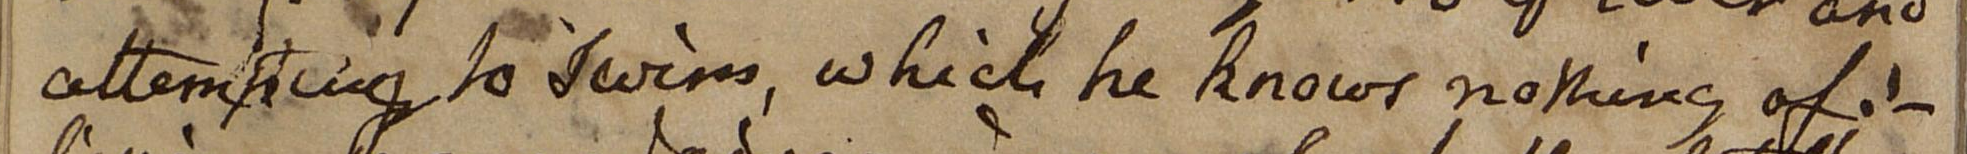attempting to Swim, which he knows nothing of-
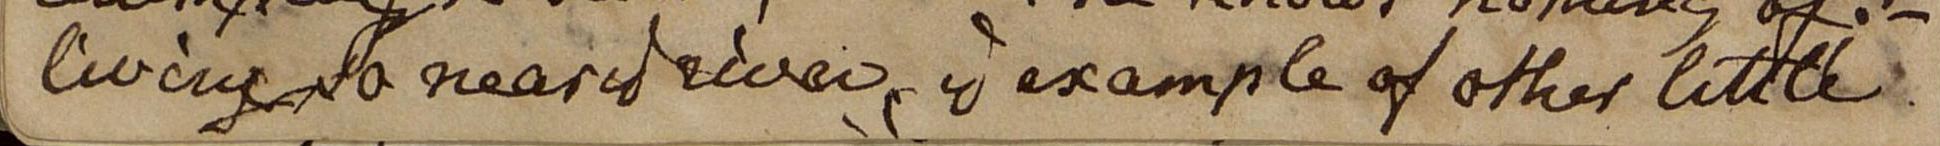living so near y^e river y^e example of other little
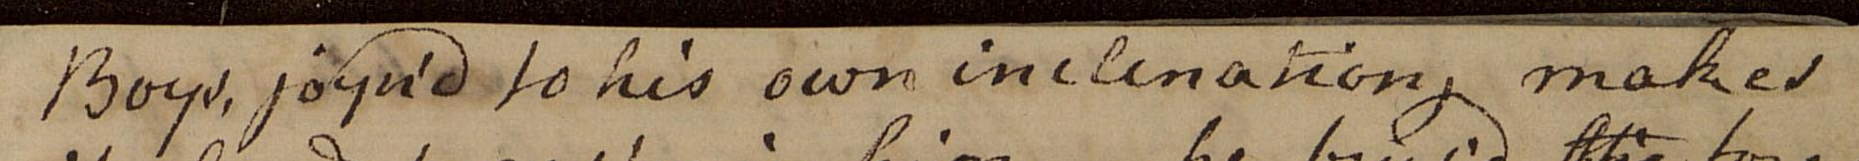Boys, join'd to his own inclination, makes
